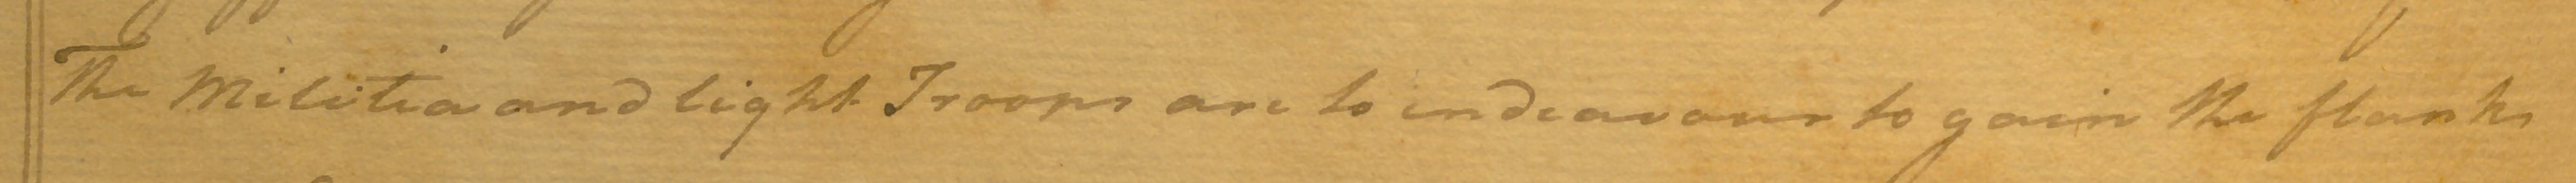The Militia and light Troops are to endeavour to gain the flanks
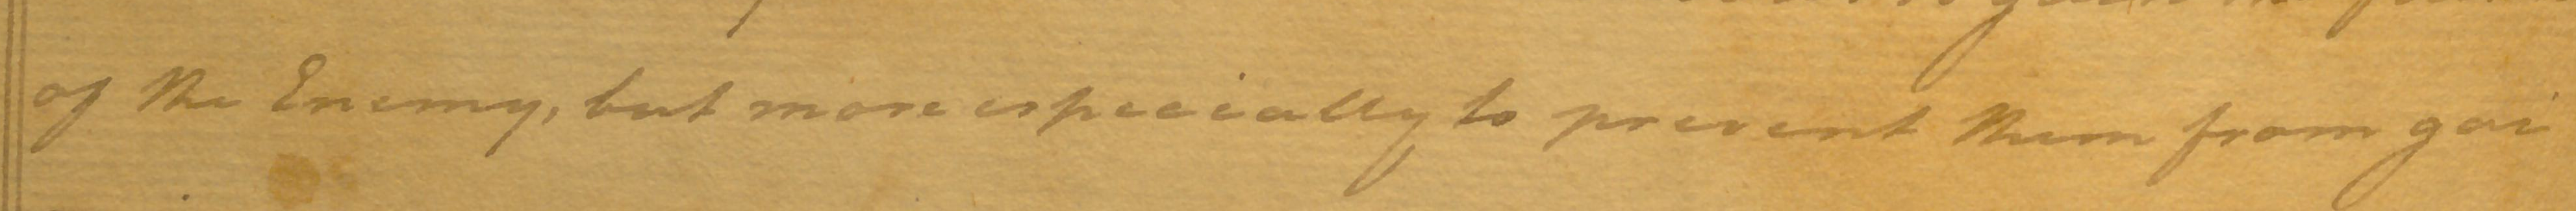of the Enemy, but more especially to prevent them from gai
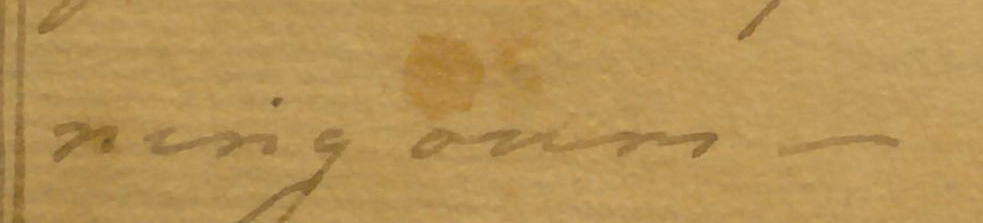ning ours-
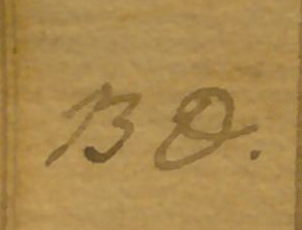BO.
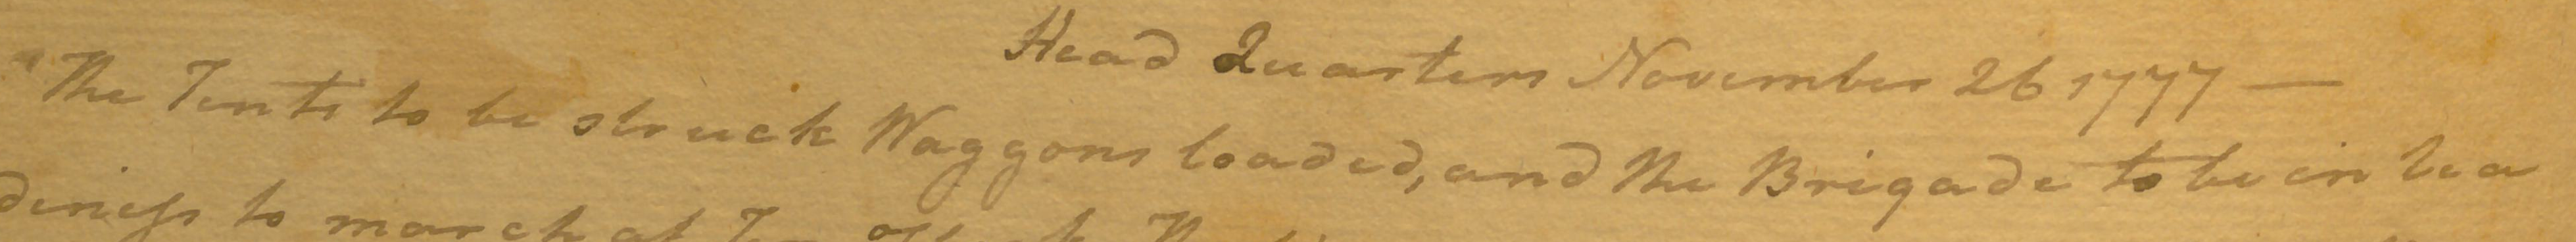The Tents to be struck Waggons loaded, and the Brigade to be in rea
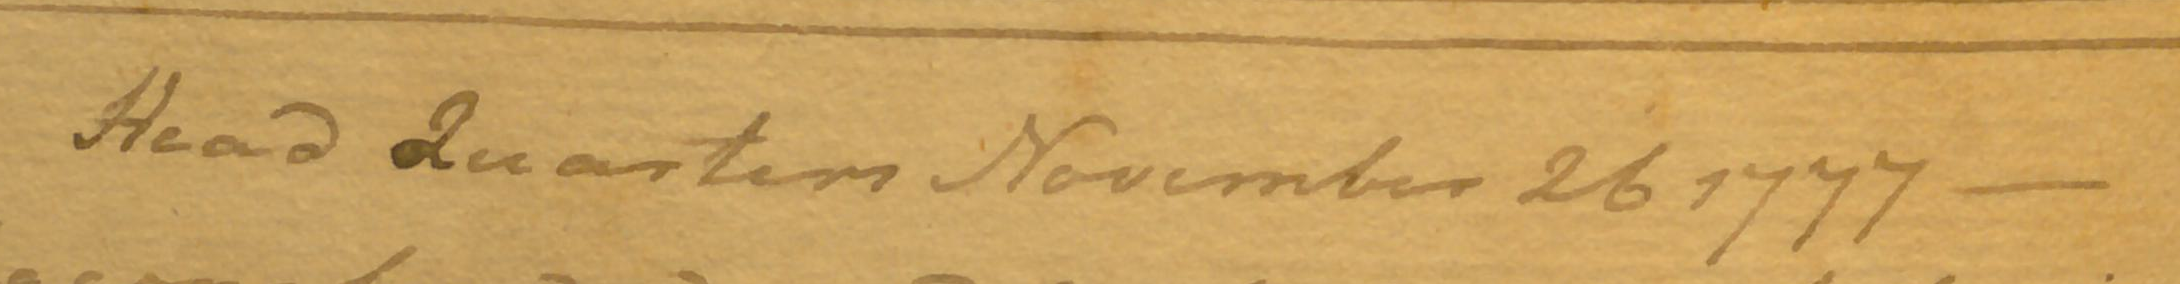Head Quarters November 26 1777-
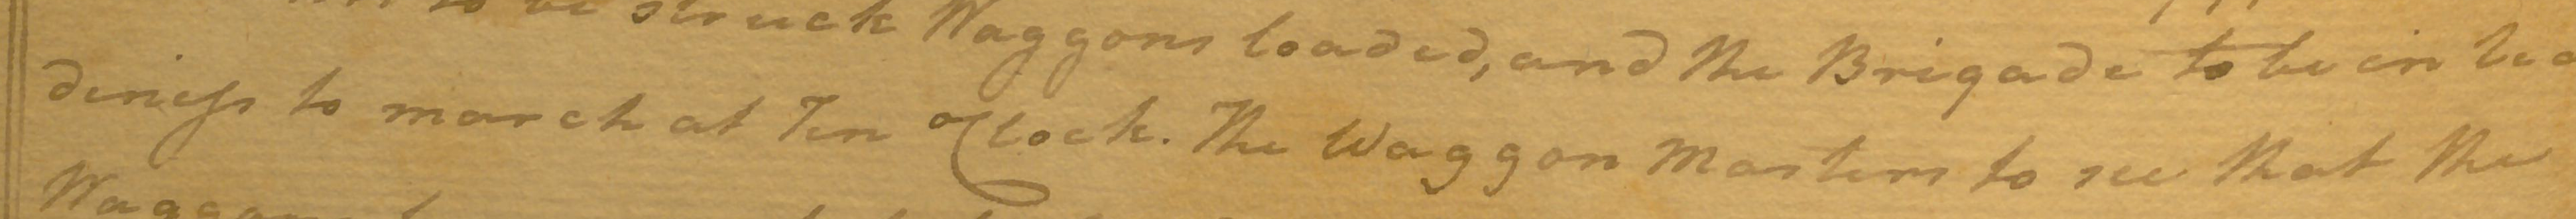diness to march at Ten ^oClock. The Waggon Masters to see that the
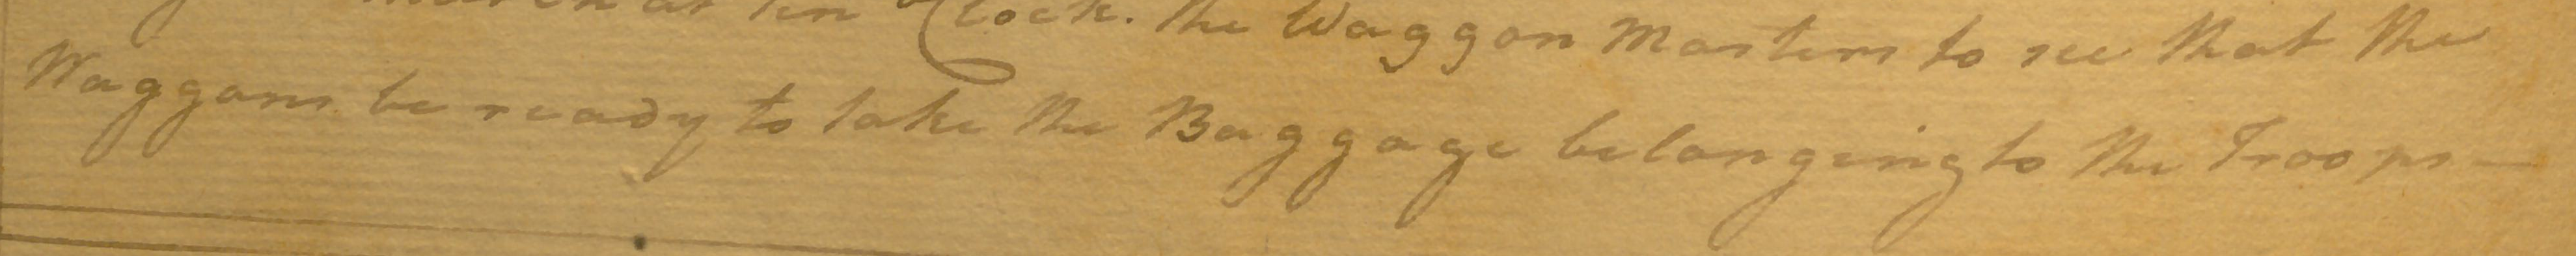waggons be ready to take the Baggage belonging to the Troops-
